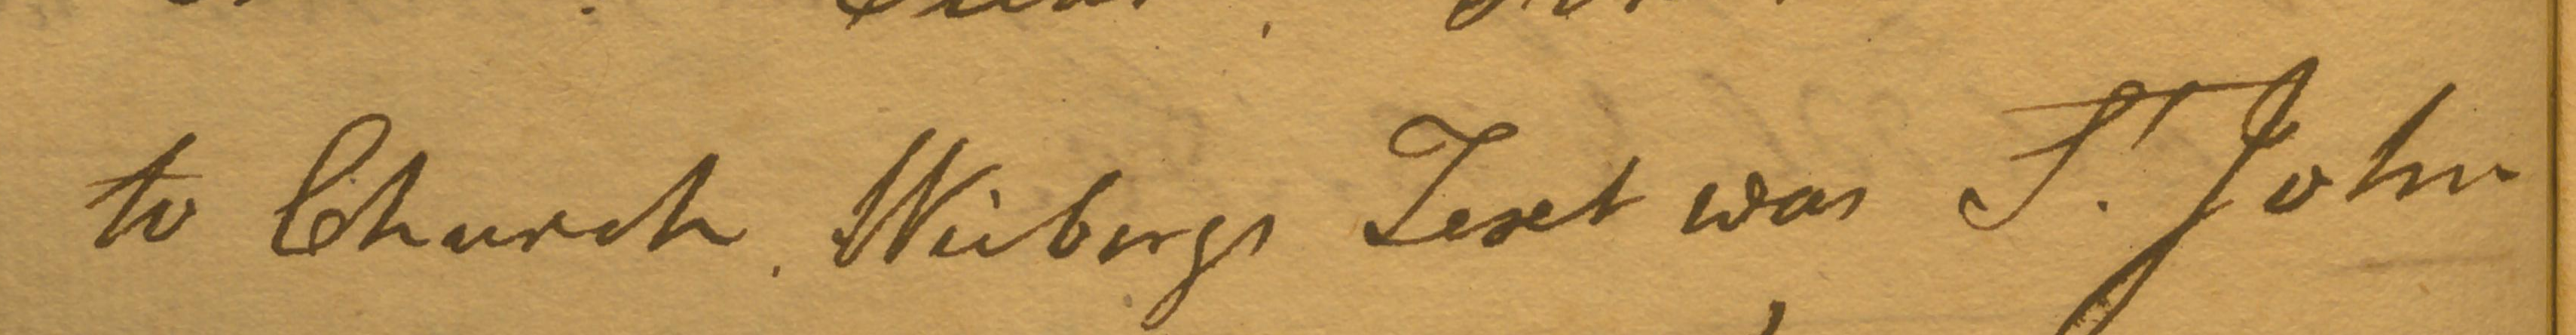to Church Weibings Text was S^t. John
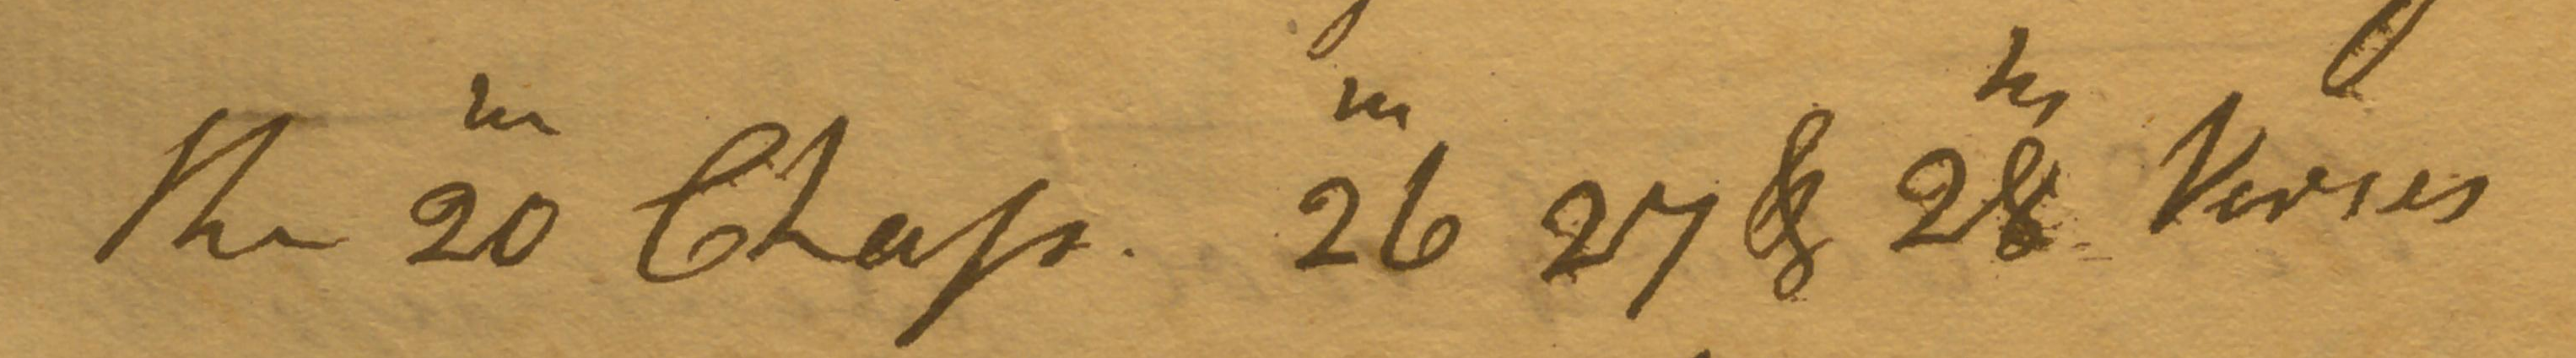the 20^th Chap. 26^th 27 & 28^th Verses
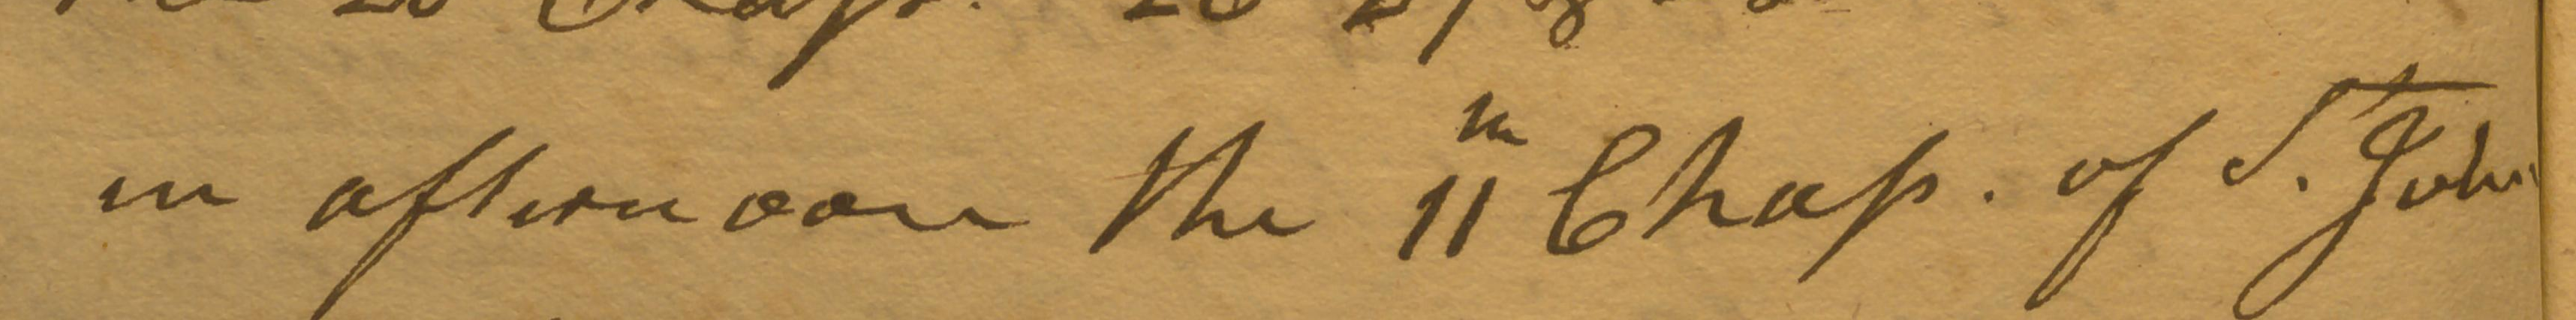in afternoon the 11^th Chap. of S^t. John
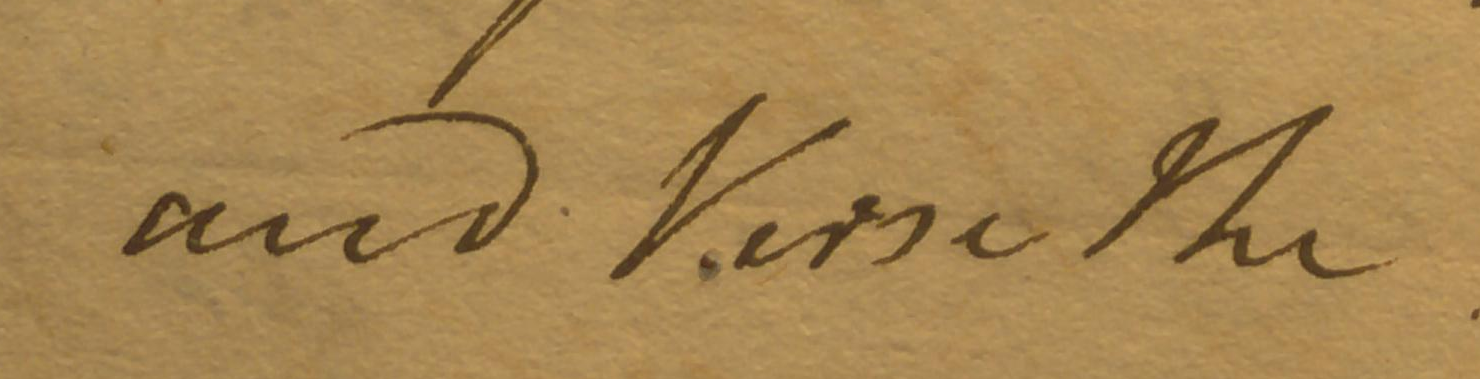and Verse the
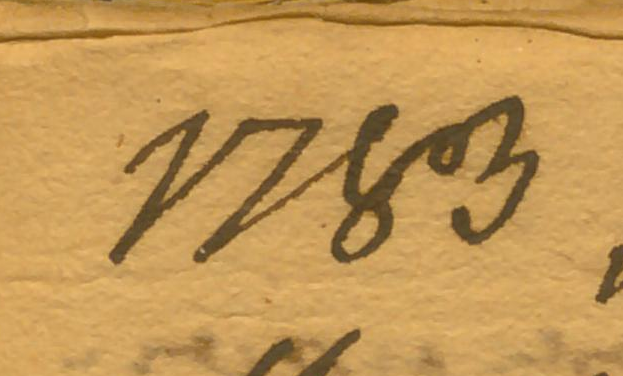1783
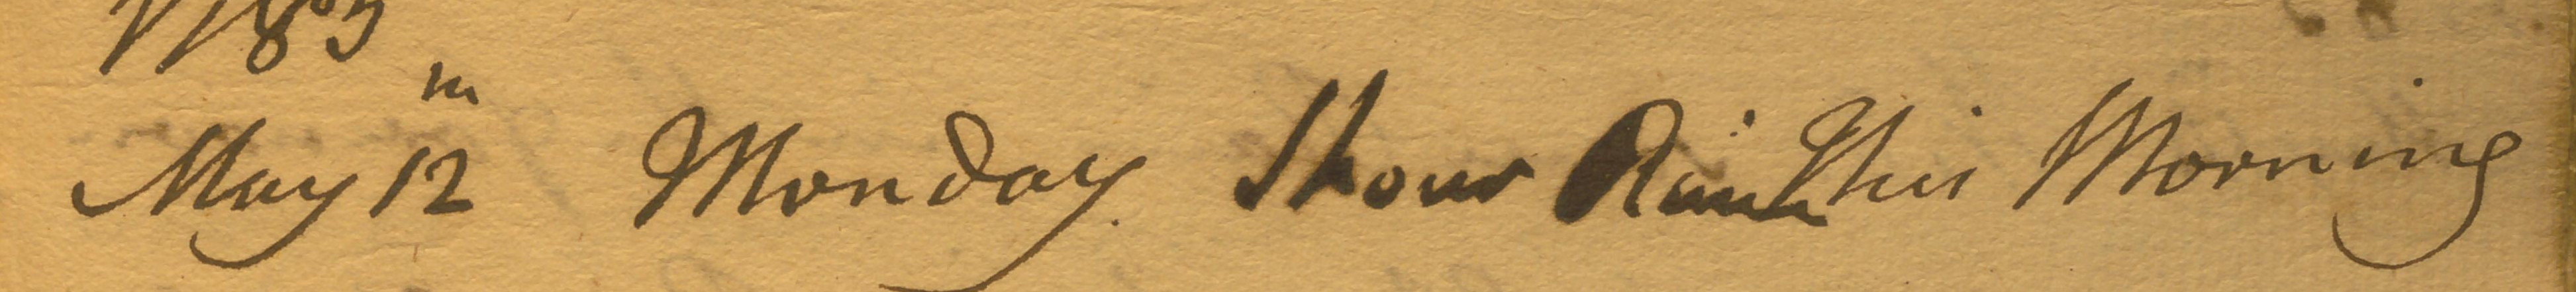May 12^th Monday Shour Rain this Morning
